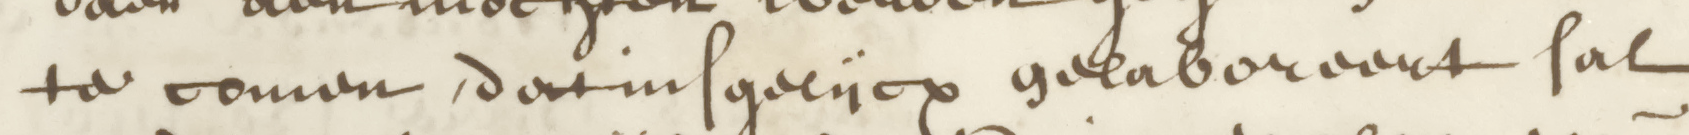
te comen, dat insgelijcx gelaboreert sal
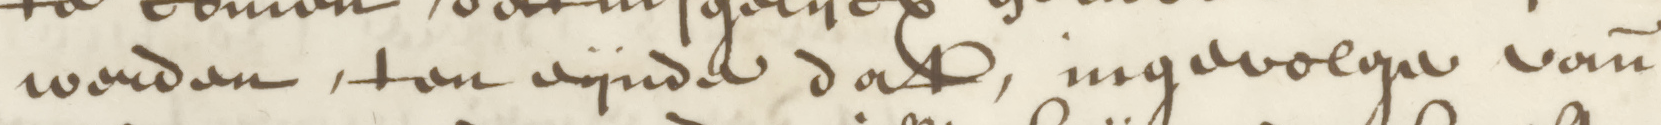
werden, ten eijnde dat, ingevolge van
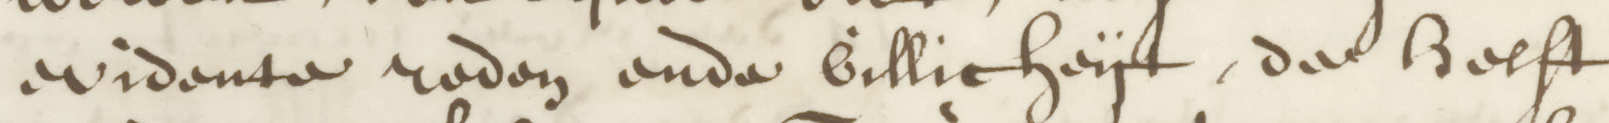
evidente reden ende billicheijt, de helft
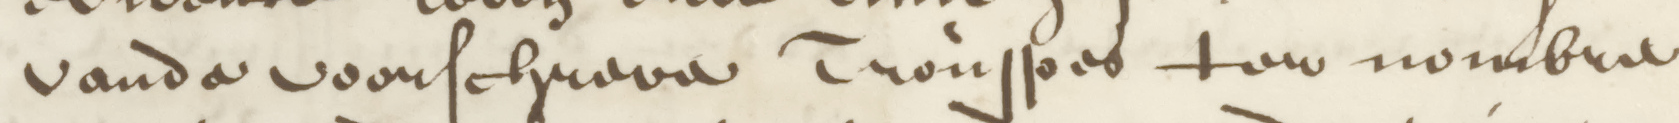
vande voorschreve Trouppes ter nombre
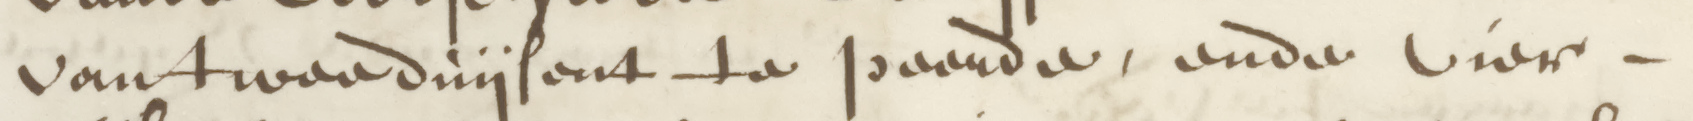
van tweeduijsent te peerde, ende vier -
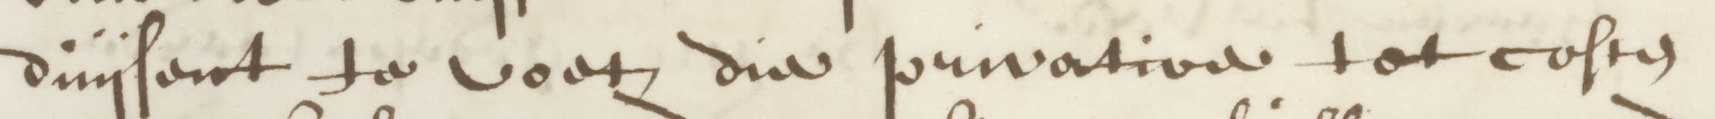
duijsent te voet, die privative tot costen
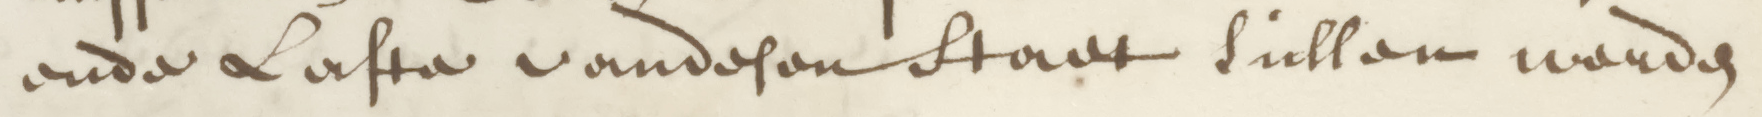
ende Laste vandesen Staet sullen werden
